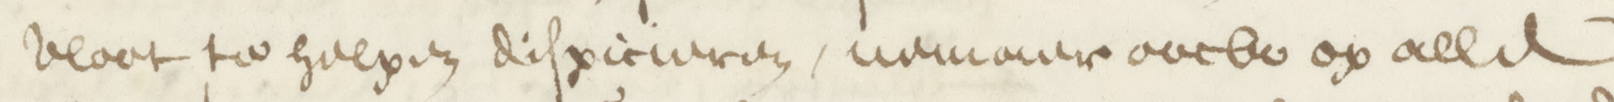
vloot te helpen dispicieren, nemaer oock op alle
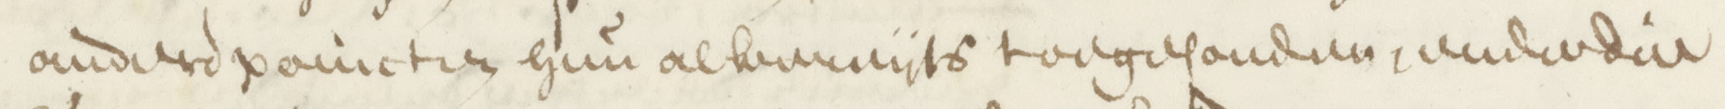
andere poincten hun albereijts toegesonden, ende die
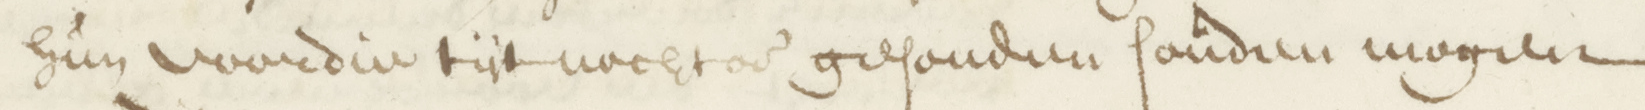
hun voor die tijt noch toegesonden souden mogen
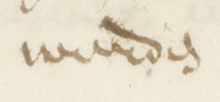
werden
